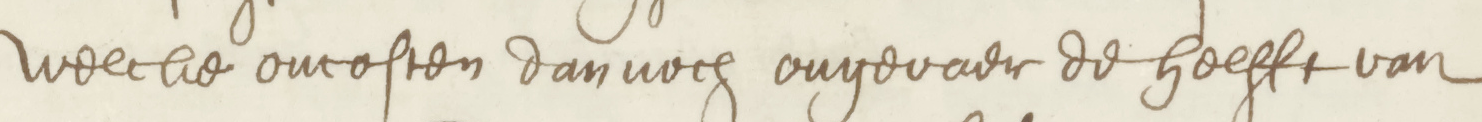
welcke oncosten dan noch ongevaer de helfft van
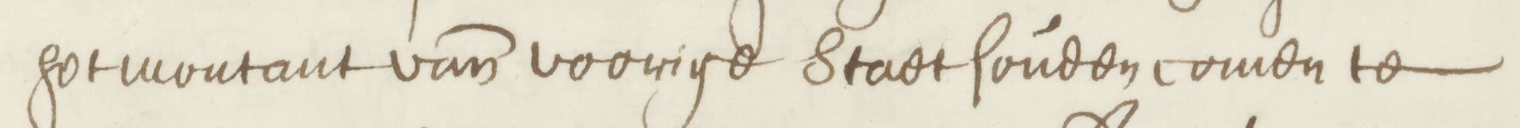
het montant van voorige Staet souden comen te
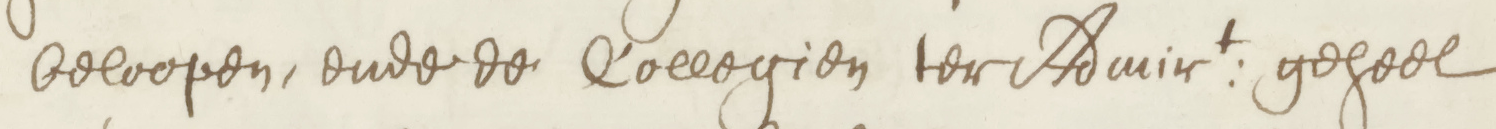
beloopen, ende de Collegien ter Admirt: geheel
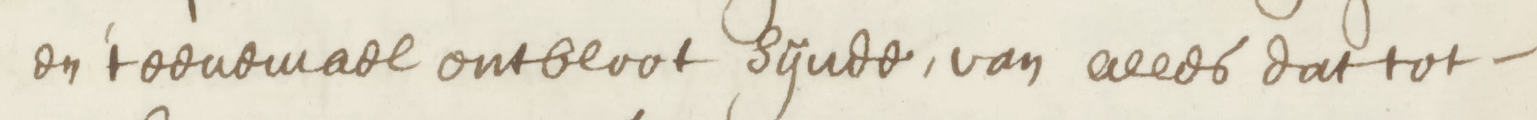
en ‛t eenemael ontbloot sijnde, van alles dat tot
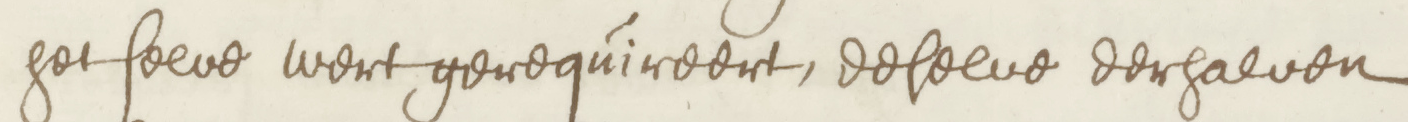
het selve wert gerequireert, deselve derhalven
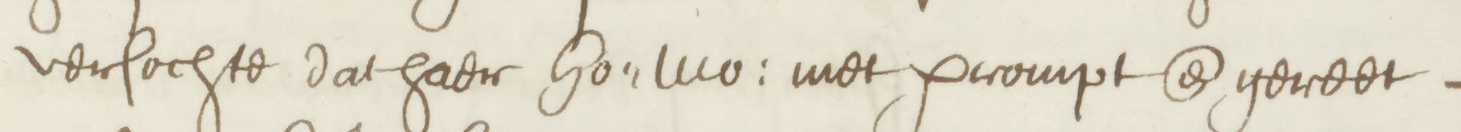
versochte dat haer ho:mo: met prompt & gereet
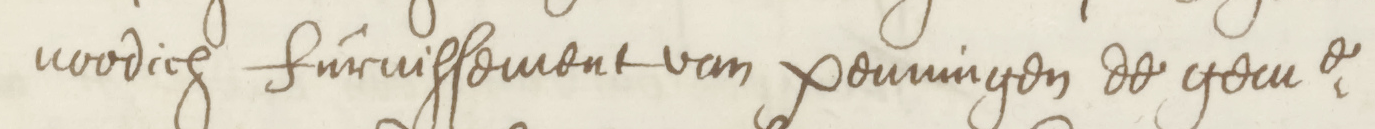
noodich furnissement van penningen de geme.
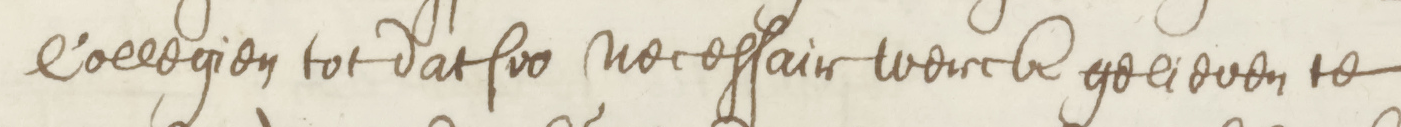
collegien tot dat soo necessair werck gelieven te
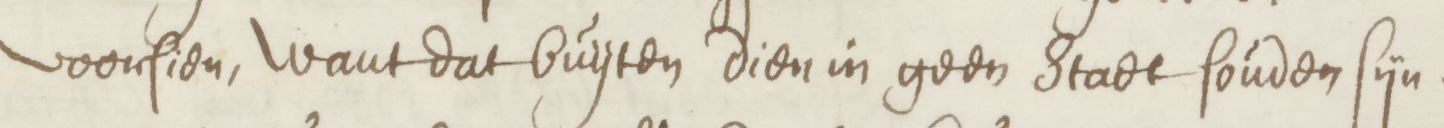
voorsien, want dat buijten dien in geen Stadt souden sijn
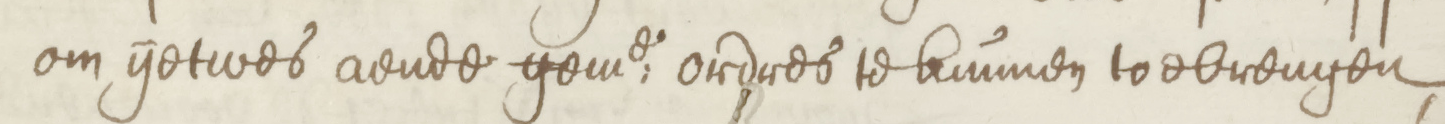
om ijetwes aende geme. ordres te kunnen toebrengen
